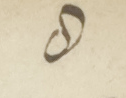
8
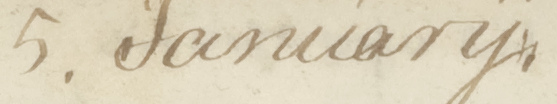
5. Januarij
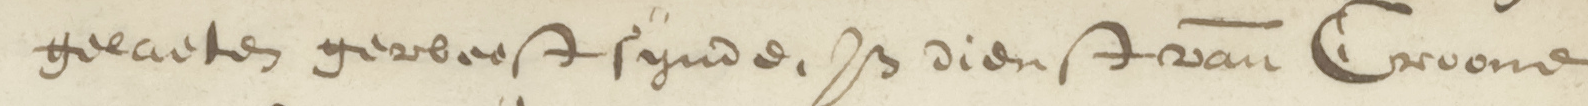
gelaeten geweest sijnde, In dienst van Croone
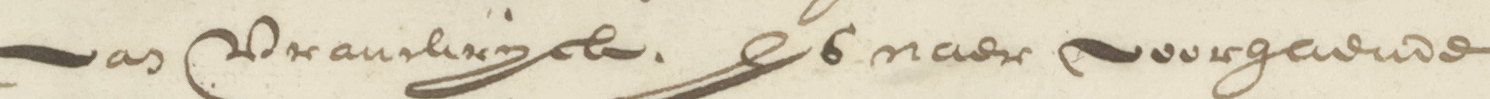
van Vranckrijck. Is naer voorgaende
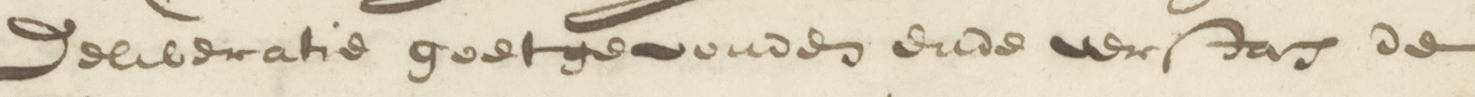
deliberatie goetgevonden ende verstaen de
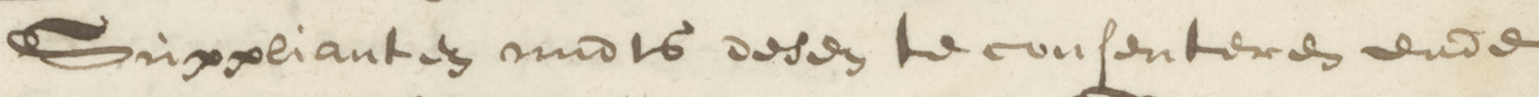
Supplianten midts desen te consenteren ende
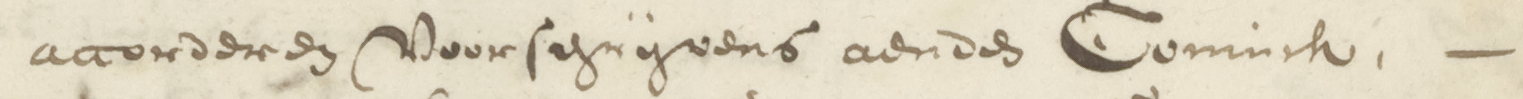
accorderen Voorschrijvens aenden Coninck, —
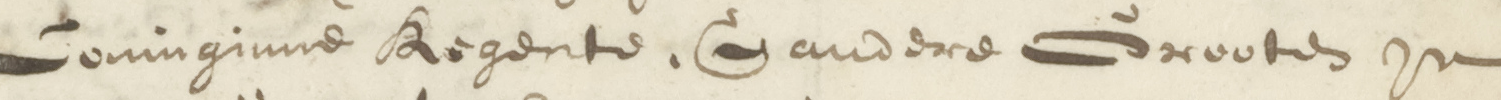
Coninginne Regente, & andere Grooten in
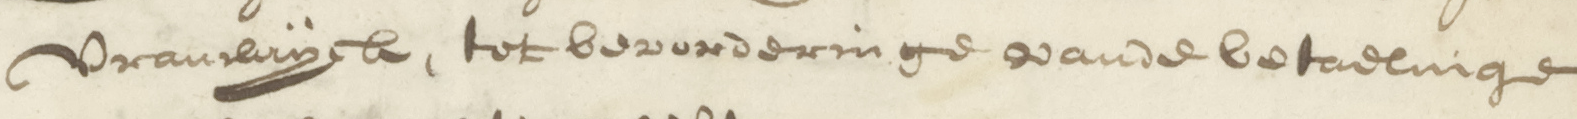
Vranckrijck, tot bevorderinge vande betaelinge
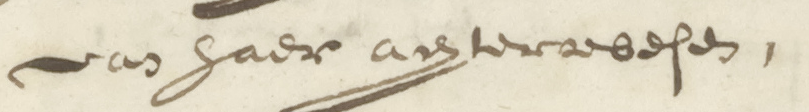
van haer achterwesen.
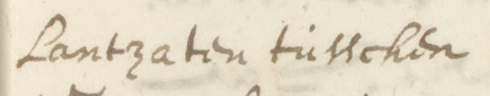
Lantzaten tusschen
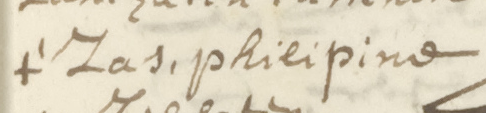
t‛ Zas, philipine
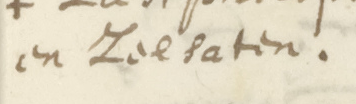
en Zelsaten.
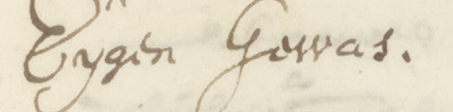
Eijgen Gewas.
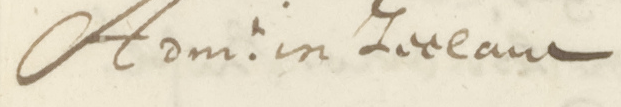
Admt. in Zeelant
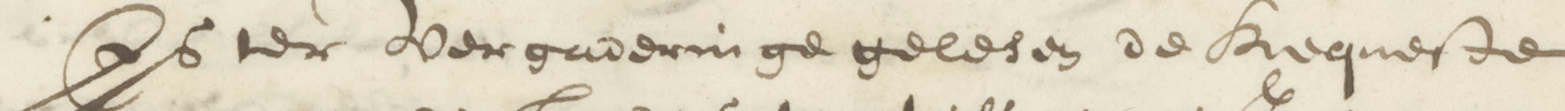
Is ter Vergaderinge gelesen de Requeste
